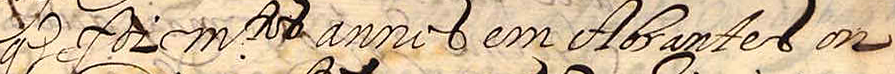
q̄ foi m.tos annos em Abrantes on
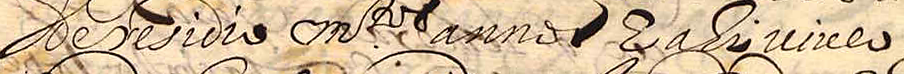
de residio m.tos annos E ahi uiueo
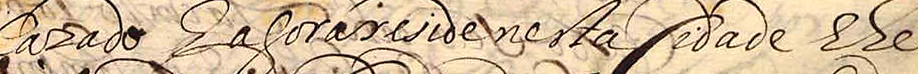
Cazado E agora reside nesta Cidade E he
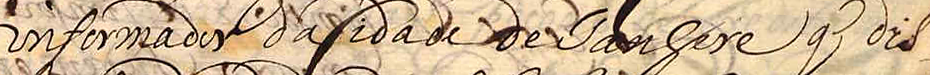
informador da Cidade de Tangere q̄ dis
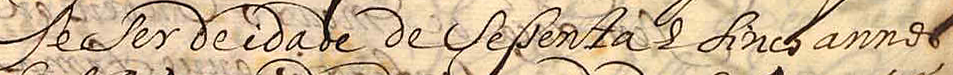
se ser de idade de sessenta E sinco annos
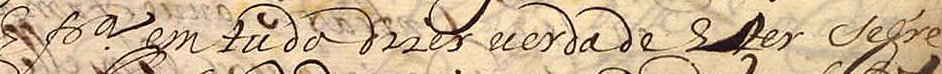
E p.a em tudo dizer uerdade E ter segre
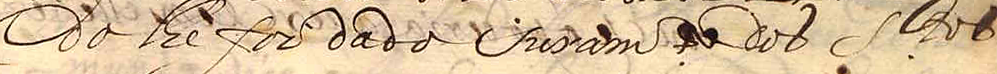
do lhe foi dado Iuramento dos s.tos
